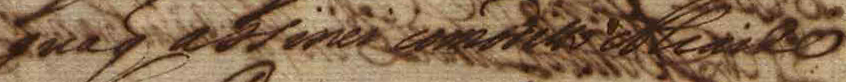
gua q̄ assinei com o ditto Alcaide
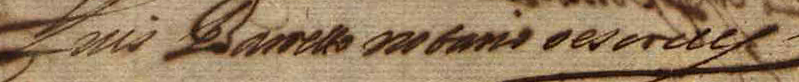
Luis Barretto notario o escreuj
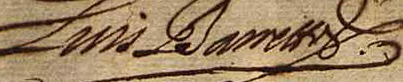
Luis Barretto
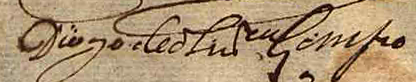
Diogo de Oliu.ra Limpo
